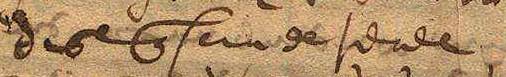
dise q̄ sera de Jdade
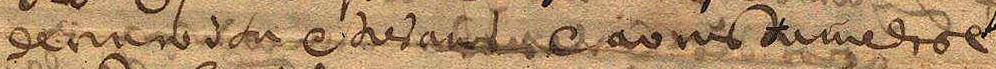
de cincoēta e tres anos e ao custume dise
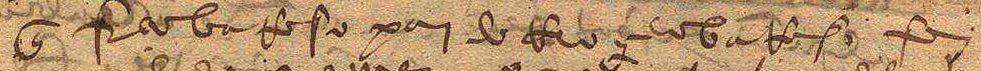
q̄ frco baRoso paj do Reo gço baRoso foj
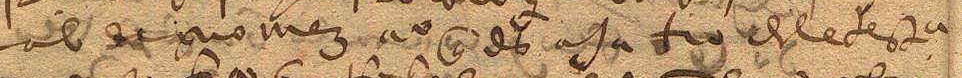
criado de guomez ao q̄ ds̄ aJa tio delle testa
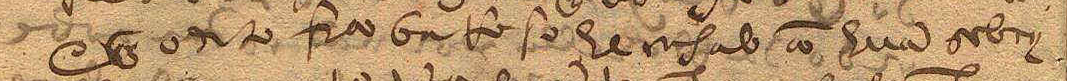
E q̄ o dito frco baRoso he casado cō huā sobry
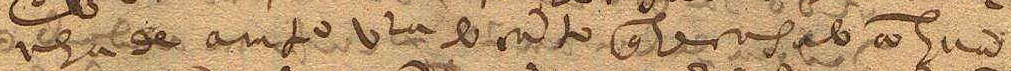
nha de amto vra do cāto q̄ he casado cō huā
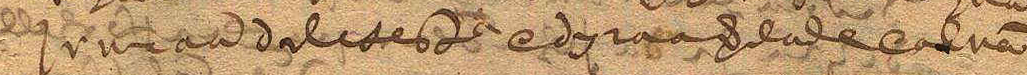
Jrmaā dele testa e dyra a ꝟdade e al não
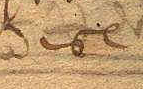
dise
